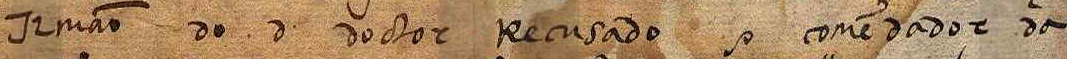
Jrmão do d. doctor Recusado e comēdador da
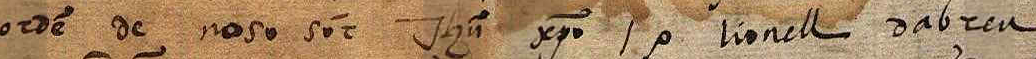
ordē de noso sōr Jhū xp̄o / e lionell dabreu
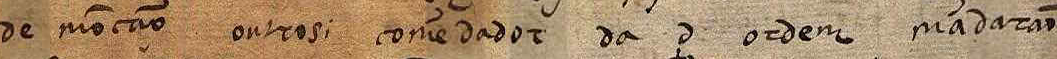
de mōção outrosi comēdador da d ordem mādarão
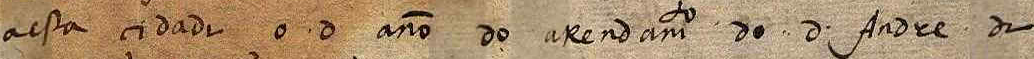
a esta cidade o d. an̄o do aRendamto do d. Andre de
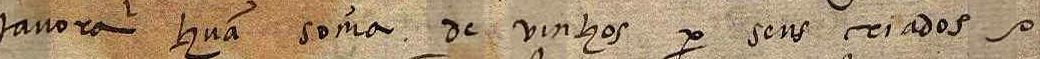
tauora huā som̄a de vinhos ꝑ seus criados e
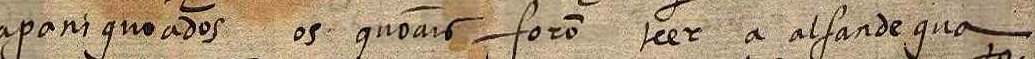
apaniguoados os quoais forō teer a alfandegua
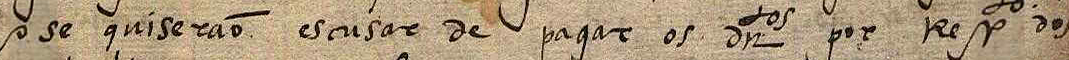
e se quiserão escusar de pagar os drrtos por Respto dos
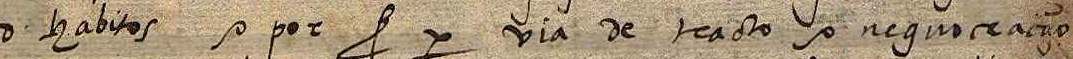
d. habitos e por e ꞩ via de tracto de neguociação
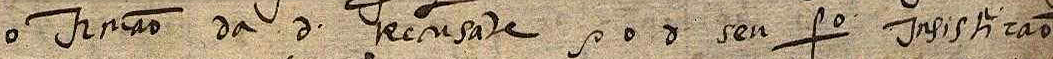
o Jrmão da d. Recusāte e o d seu fo Jnsistirão
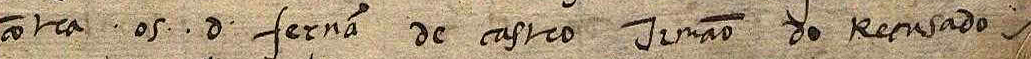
c̄otra os d fernā de castro Jrmão do Recusado
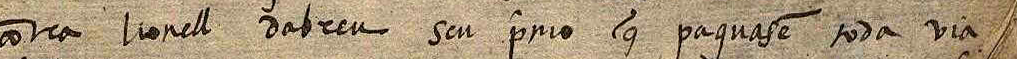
cōtra lionell dabreu seu p̄mo q̄ paguasē todavia
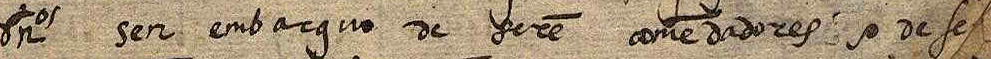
drrtos sem embarguo de serē com̄edadores e de se
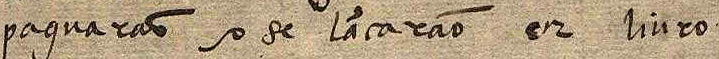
paguarão e se lāçarão em liuro
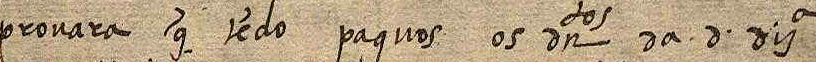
prouara q̄ tēdo paguos os drrtos da d. diza
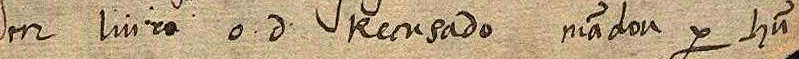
em liuro o d. Recusado mādou ꝑ hū
